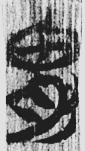{胃刀}（謂）
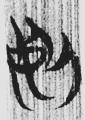死
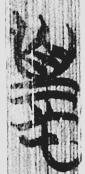辠（罪）
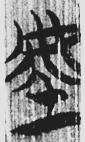○（吾）
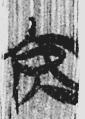安
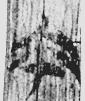尔（爾）
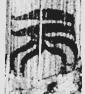而
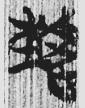埶（設）
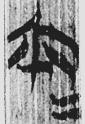尔
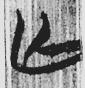亡（無）
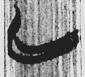㠯（以）
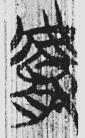○（慮）
